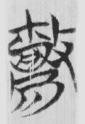{㐭泉攴}
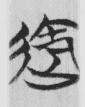御
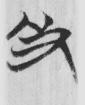及
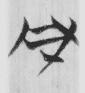凡
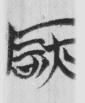庶
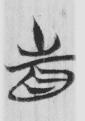眚
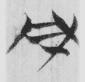凡
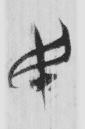民
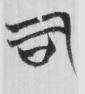司
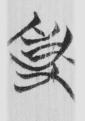事
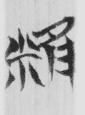{米隹}
